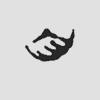自
